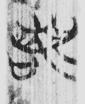若
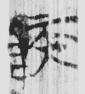疾
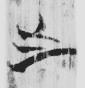之
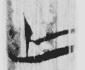亡
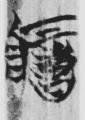{疒意}
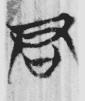君
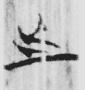之
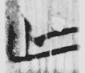亡
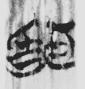䎽
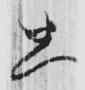也
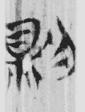則
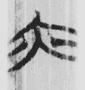亦
